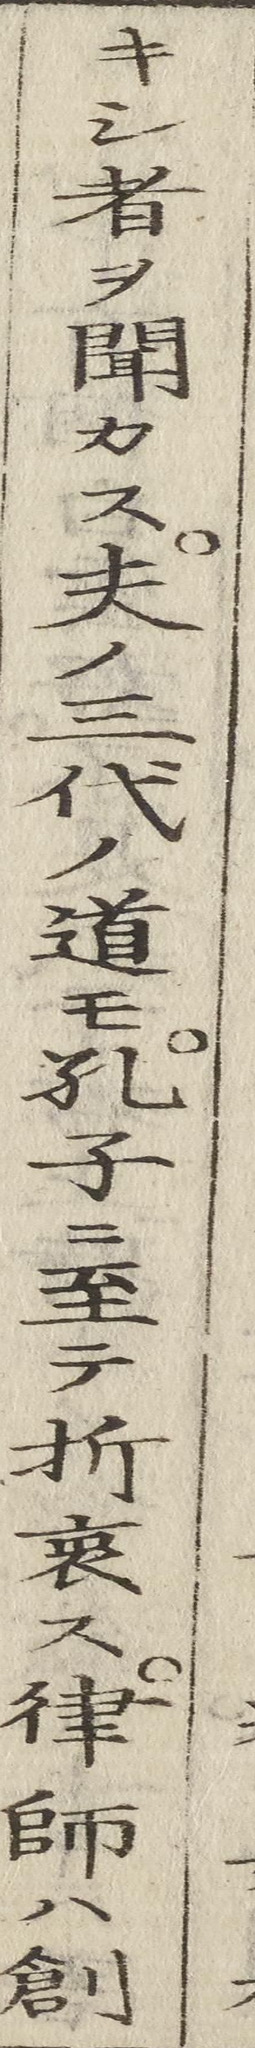キシ者ヲ聞カス。夫ノ三代ノ道モ。孔子ニ至テ折衷ス。律師ハ創
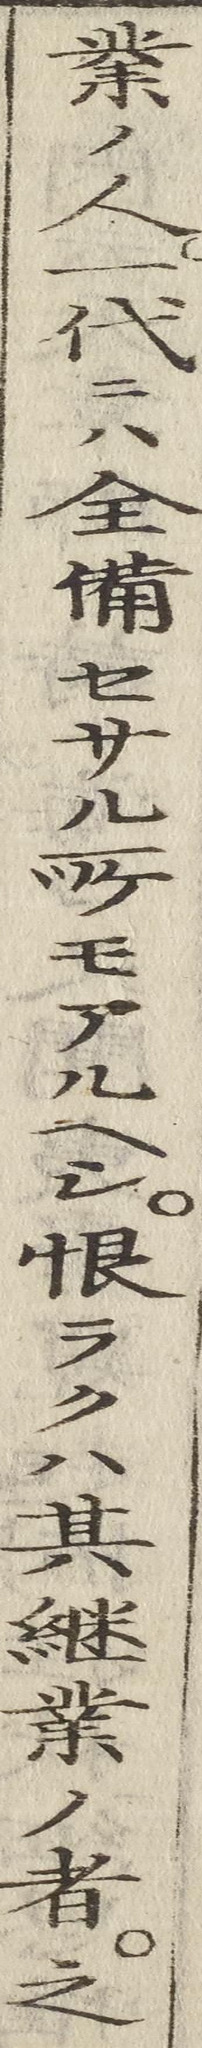業ノ人。一代ニハ全備セサル所モアルヘシ。恨ラクハ其継業ノ者。之
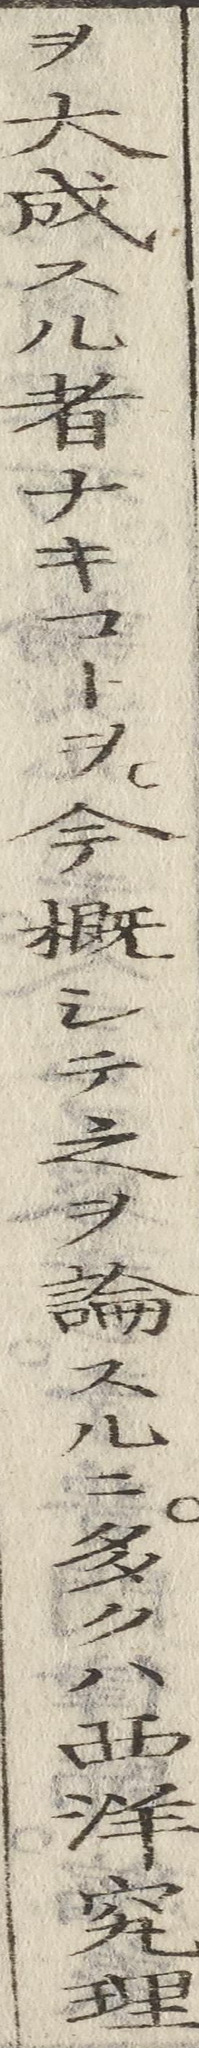ヲ大成スル者ナキコトヲ。今概シテ之ヲ論スルニ。多クハ西洋究理
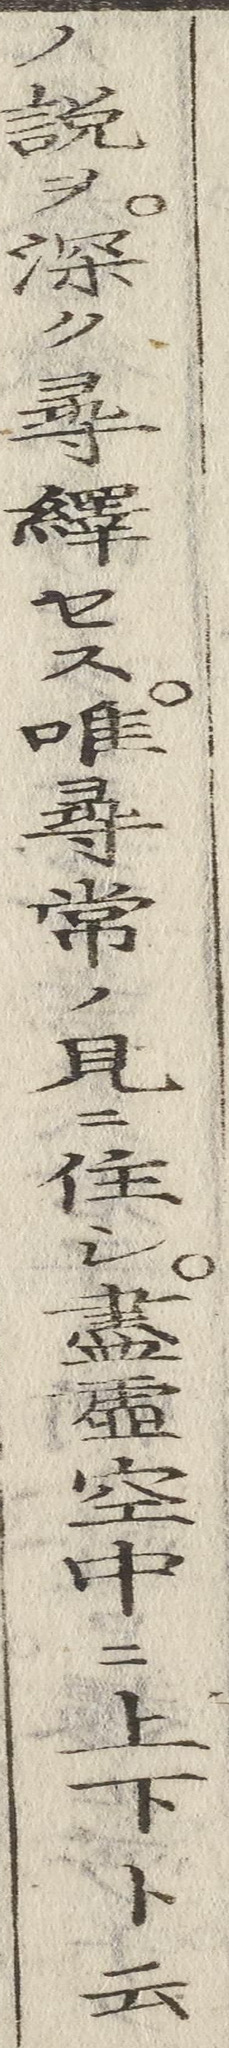ノ説ヲ。深ク尋繹セス。唯尋常ノ見ニ住シ。尽虚空中ニ上下ト云
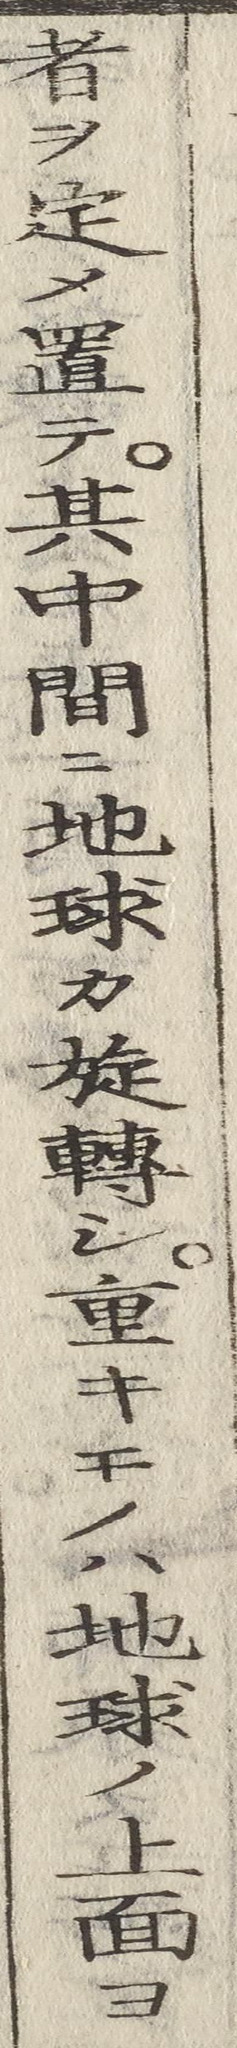者ヲ定メ置テ。其中間ニ地球カ旋転シ。重キモノハ地球ノ上面ヨ
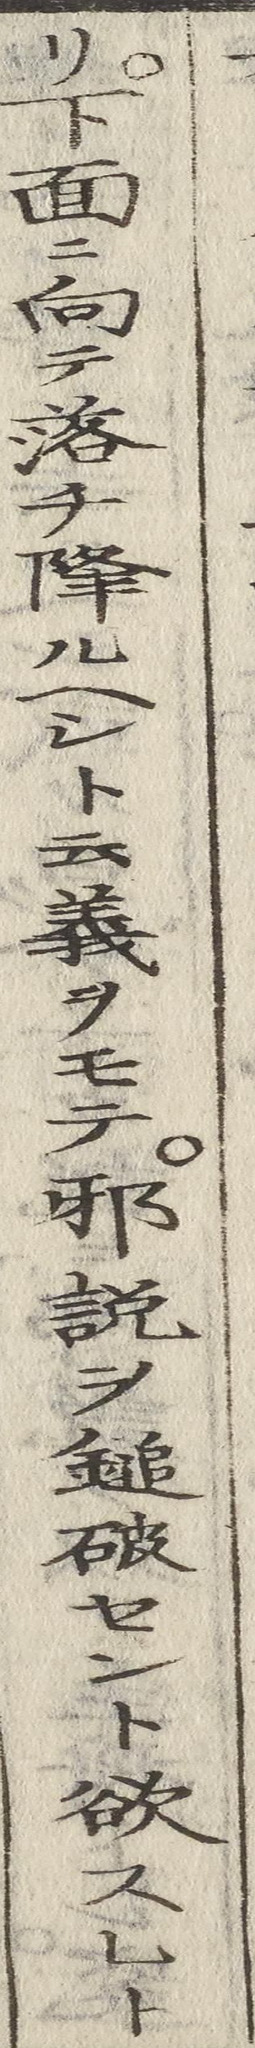リ。下面ニ向テ落チ降ルヘシト云義ヲモテ。邪説ヲ鎚破セント欲スレト
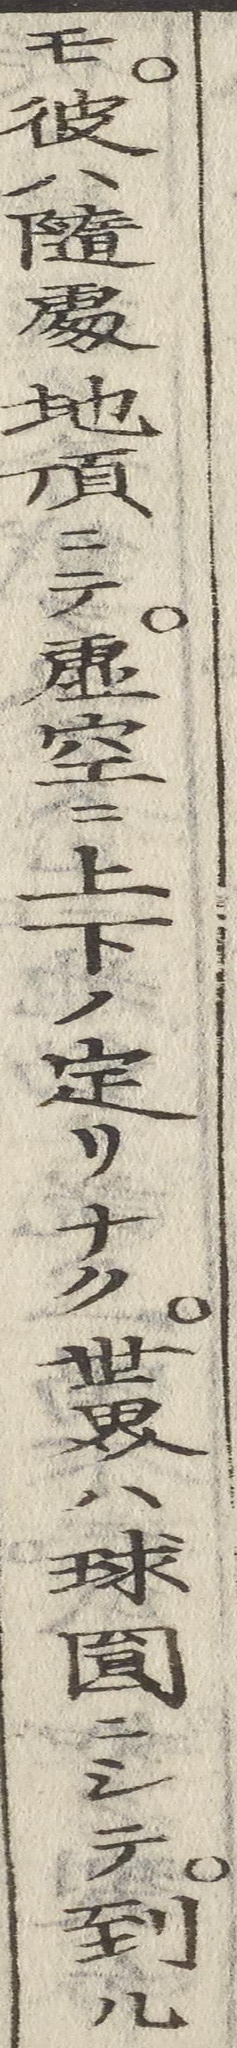モ。彼ハ随処地頂ニテ。虚空ニ上下ノ定リナク。世界ハ球円ニシテ。到ル
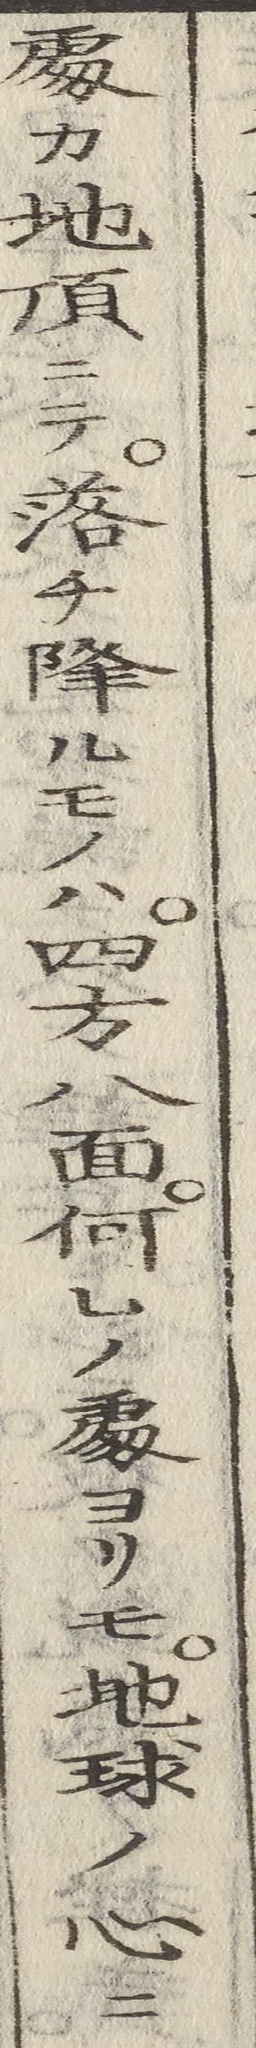処カ地頂ニテ。落チ降ルモノハ。四方八面。何レノ処ヨリモ。地球ノ心ニ
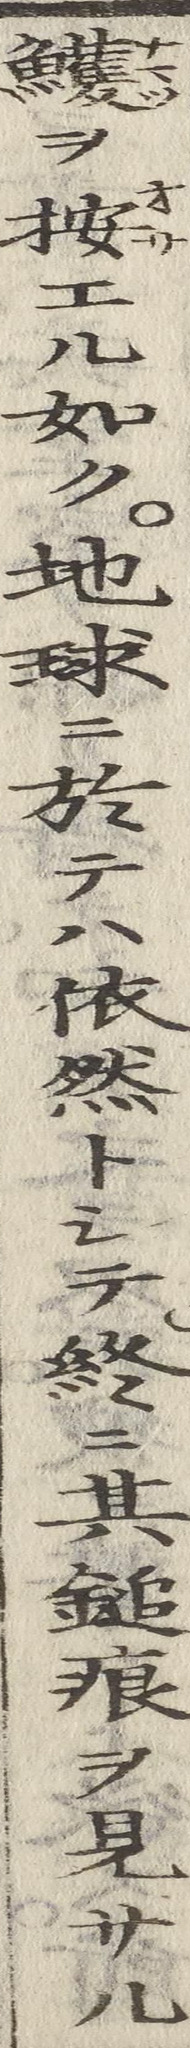鱯ヲ按エル如ク。地球ニ於テハ依然トシテ。終ニ其鎚痕ヲ見サル
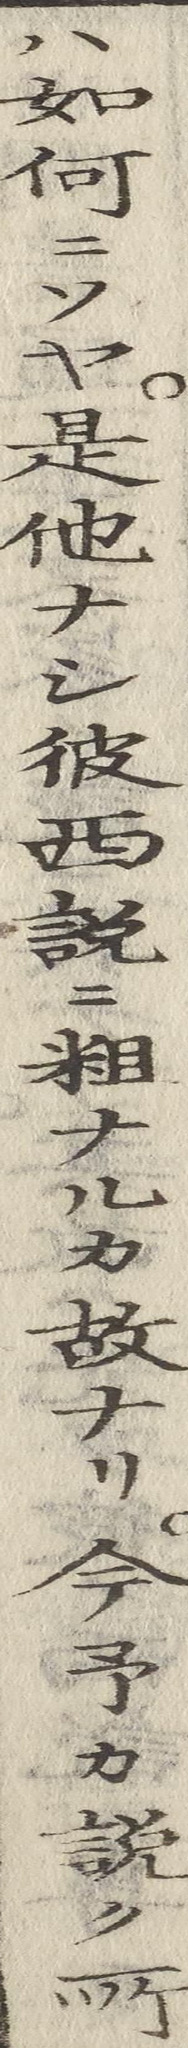ハ如何ニソヤ。是他ナシ彼西説ニ粗ナルカ故ナリ。今予カ説ク所

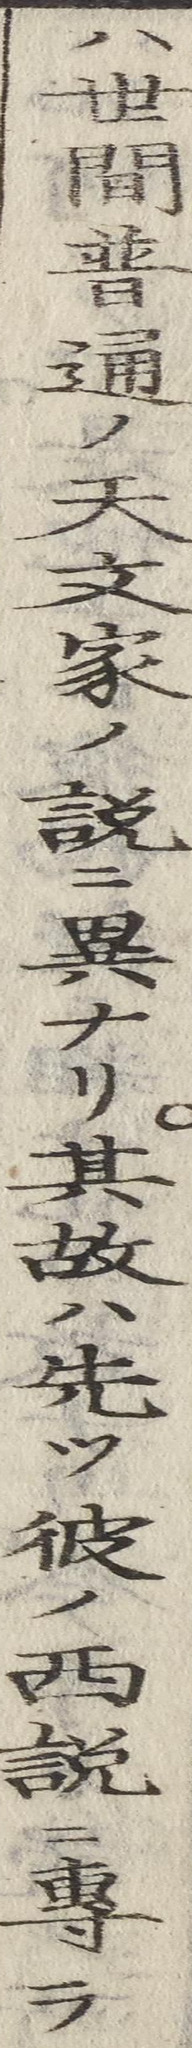ハ。世間普通ノ天文家ノ説ニ異ナリ。其故ハ先ツ彼ノ西説ニ専ラ
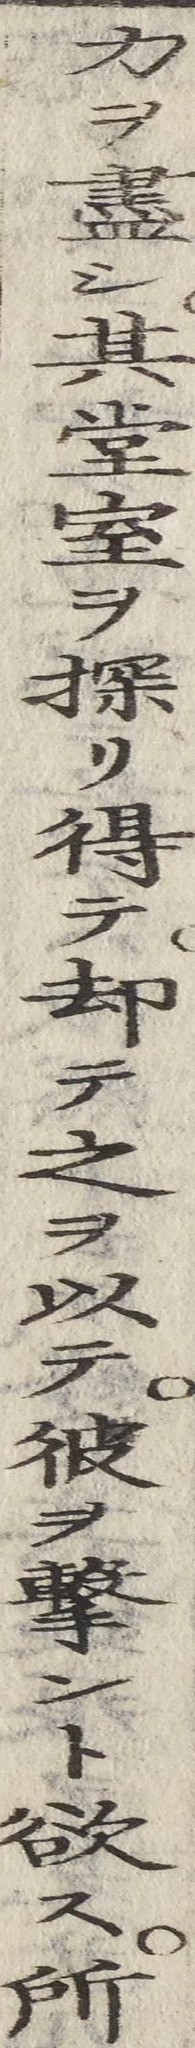力ヲ尽シ。其堂室ヲ探リ得テ。却テ之ヲ以テ。彼ヲ撃ント欲ス。所
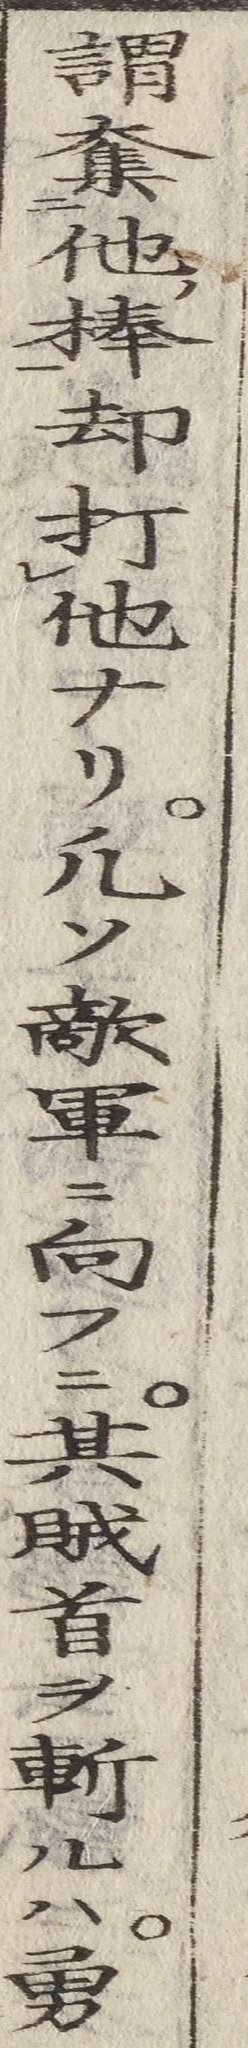謂奪他棒却打他ナリ。凡ソ敵軍ニ向フニ。其賊首ヲ斬ルハ。勇
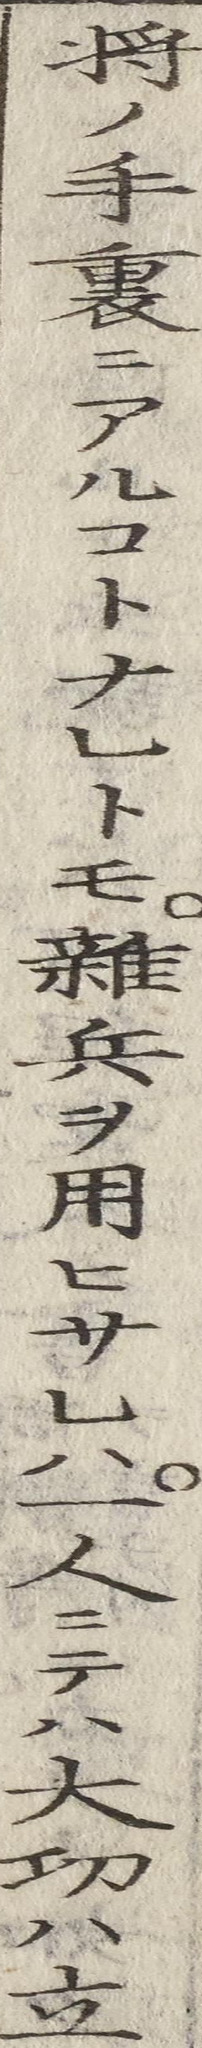将ノ手裏ニアルコトナレトモ。雑兵ヲ用ヒサレハ。一人ニテハ大功ハ立
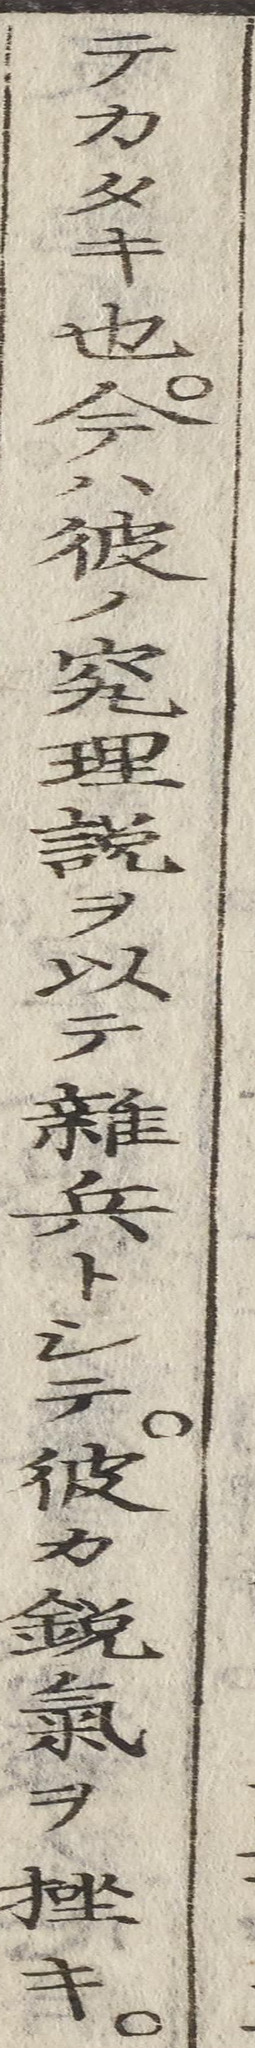テカタキ也。今ハ彼ノ究理説ヲ以テ雑兵トシテ。彼カ鋭気ヲ挫キ。
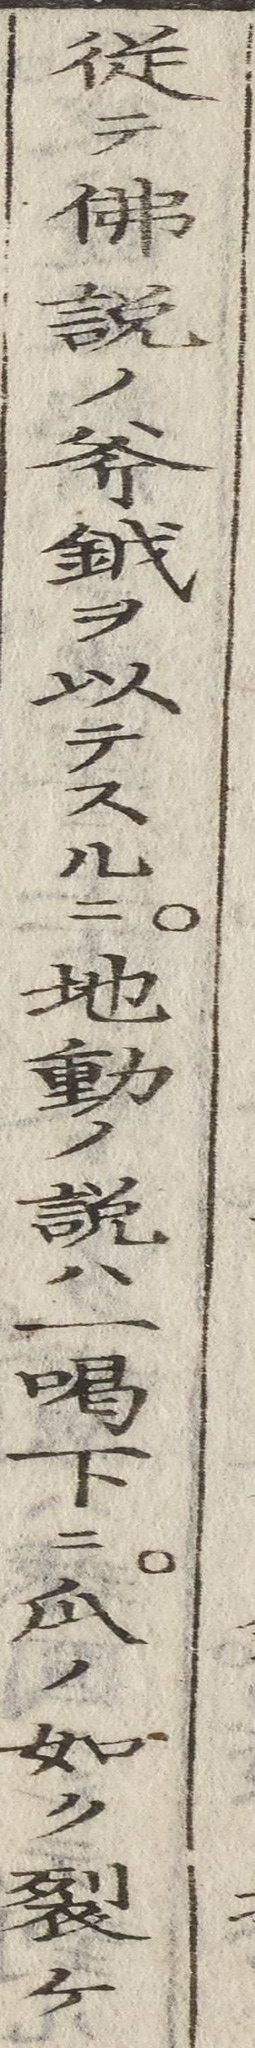従テ仏説ノ斧鉞ヲ以テスルニ。地動ノ説ハ一喝下ニ。瓜ノ如ク裂ケ
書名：護法新論　上
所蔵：東京大学地震研究所図書室 Earthquake Research Institute Library, The University of Tokyo, JAPAN
